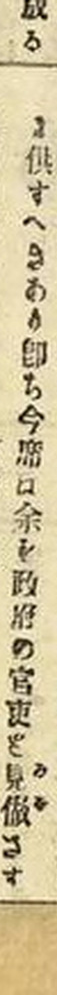に供すへきあり即ち今席は余を政府の官吏と見做さす
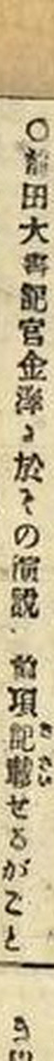〇前田大書記官金沢に於ての演説前項記載せるがごと
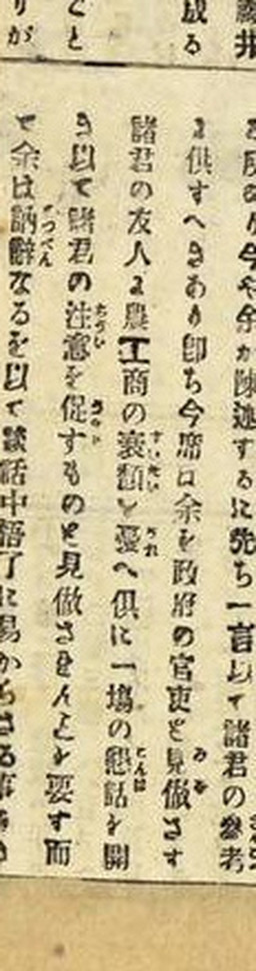諸君の友人に農工商の衰頽を憂へ倶に一場の懇話を開
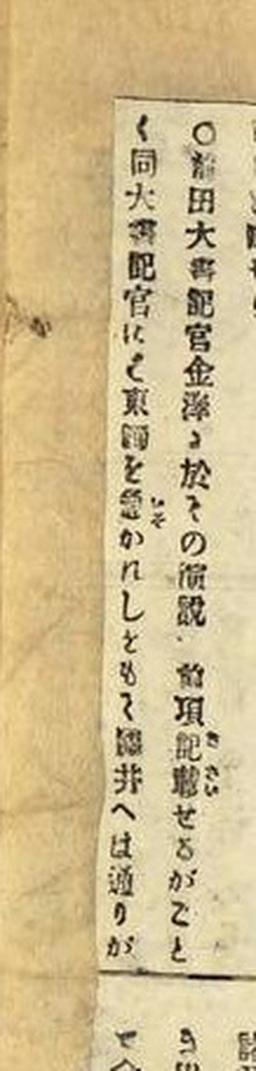く同大書記官には東帰を急かれしをもて福井へは通りが
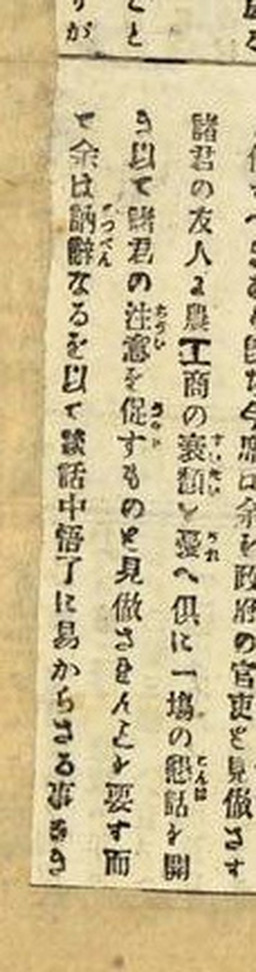き以て諸君の注意を促すものと見做されんことを要す而
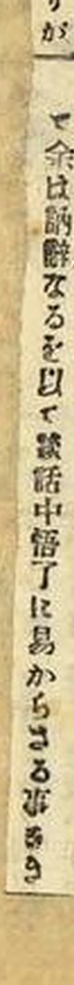て余は訥弁なるを以て談話中悟了に易からさる事なき

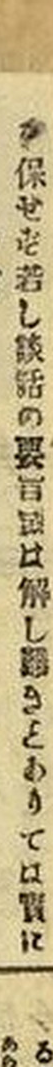を保せず若し談話の要旨或は解し難きことありては実に
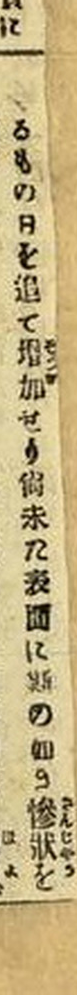るもの日を追て増加せり尚未た表面に斯の如き惨状を
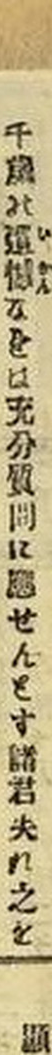千歳の遺憾なれは充分質問に応せんとす諸君夫れ之を
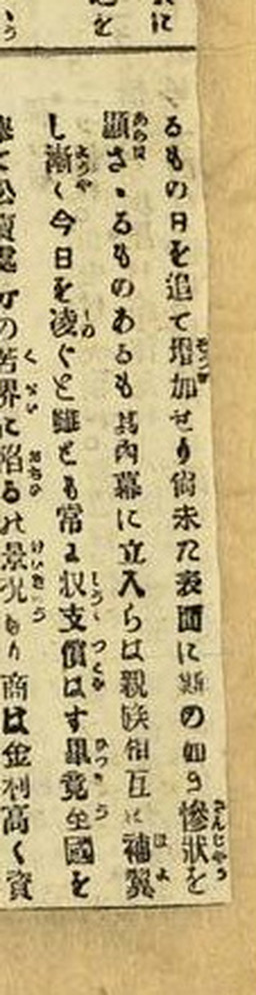顕ゝるものあるも其内幕に立入らは親族相互に補翼
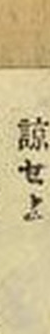諒せよ
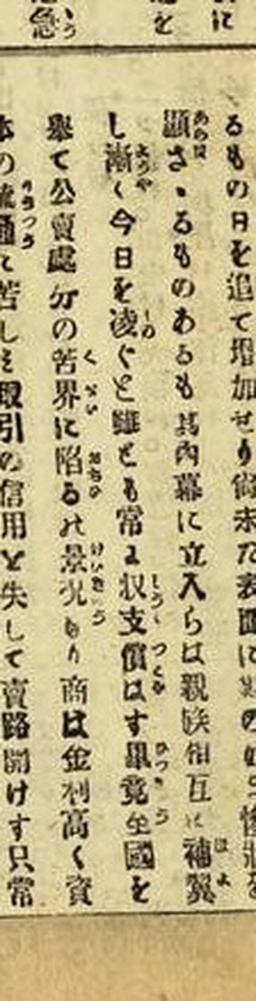し漸く今日を凌ぐと雖とも常に収支償はす畢竟全国を
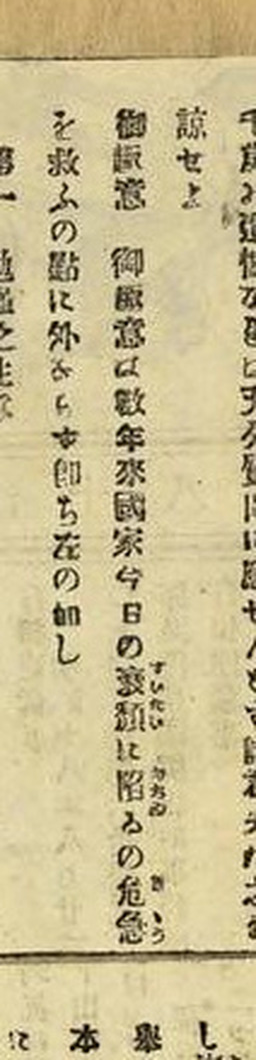御趣意御趣意は数年来国家今日の衰頽に陥るの危急
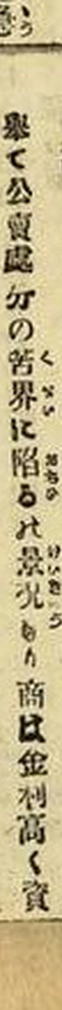挙て公売処分の苦界に陥るの景況なり商は金利高く資
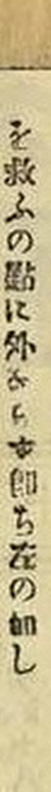を救ふの点に外ならす即ち左の如し
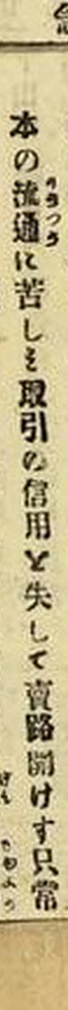本の流通に苦しみ取引の信用を失して売路開けす只常
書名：温古集 五巻
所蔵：福井県文書館 Fukui Prefectural Archives
